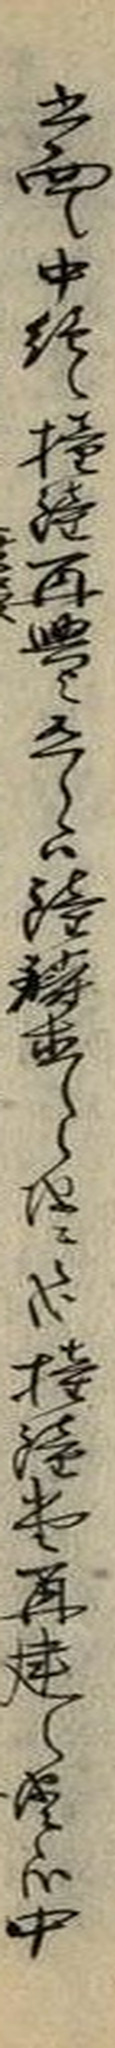書面之中絶之撞鐘再興与有之候ハ鐘鋳直し候儀ニ候哉撞鐘堂再建之儀ニ候哉中
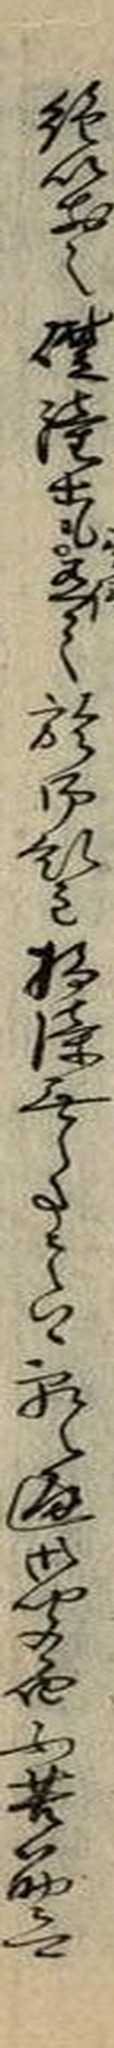絶以前之礎鐘等も其儘有之於御領主指障無之事ニ候ハヽ願之通御聞届不苦筋ニ可
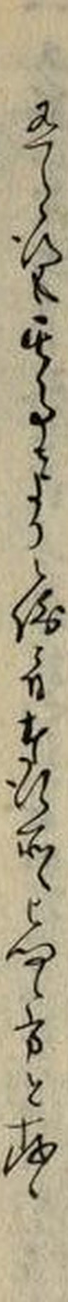有之候得共其事ニより候儀ニ付奉行所へ被問候方と存候
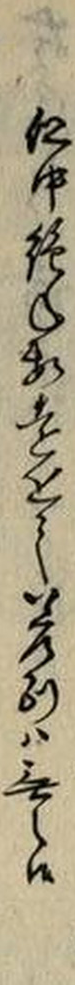但中絶年数遠近之差別ハ無之候
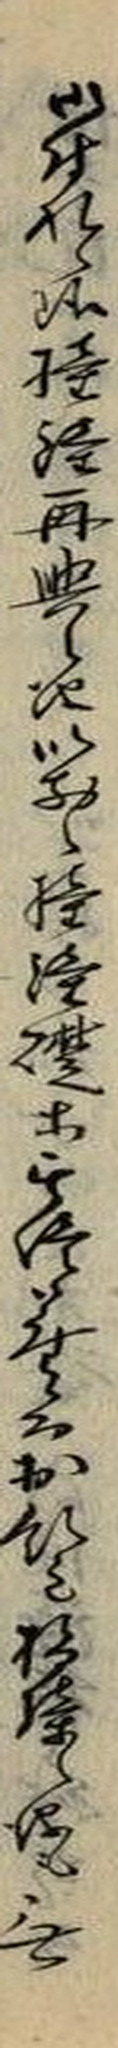御付札之趣撞鐘再興之儀以前之撞鐘礎等其儘御座候而於領主指障候義も無
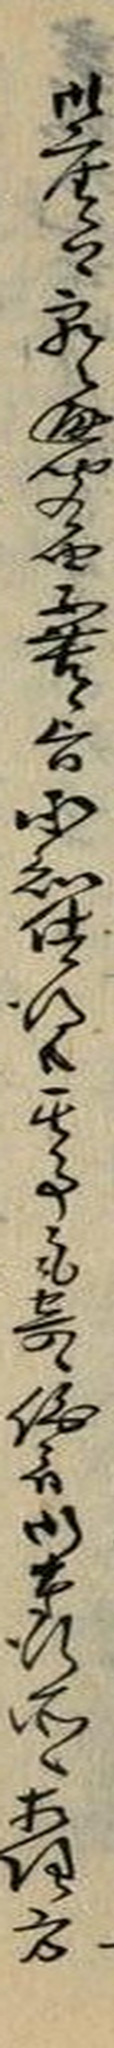御座候ハヽ願之通聞届不苦候旨承知仕候得其事ニも寄候儀ニ付御奉行所へ相伺候方
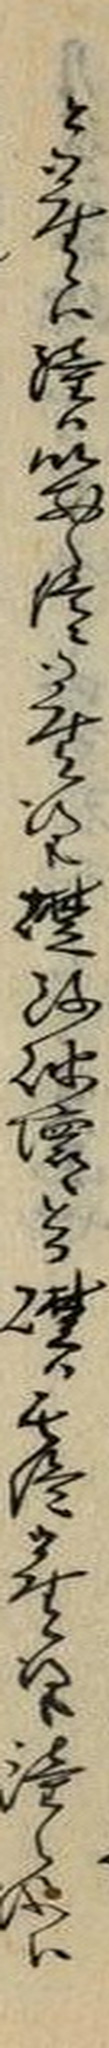と御座候ハ鐘ハ以前之儘ニ御座候得共礎致破壊候とか礎ハ其儘御座候得共鐘之儀ハ
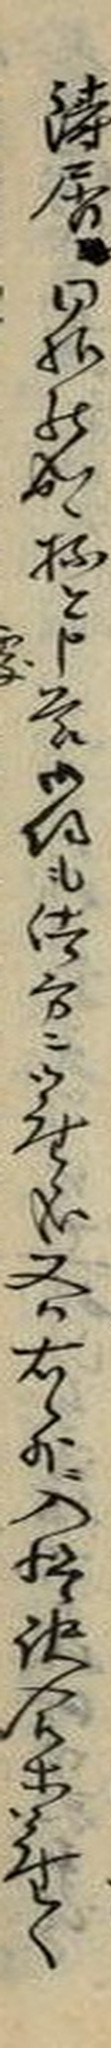鋳屑同様罷成候抔と申節御伺も仕候方ニ御座候哉又ハ右之外ニ入組候訳合等御座候
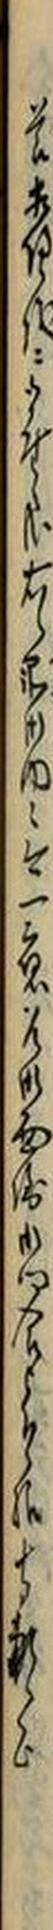節相伺候儀ニ御座候哉右之処御内々今一応乍御面倒御問合被下候様奉頼候已上
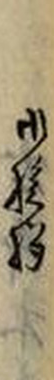御挨拶
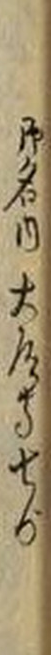五月御名内大道寺七右衛門
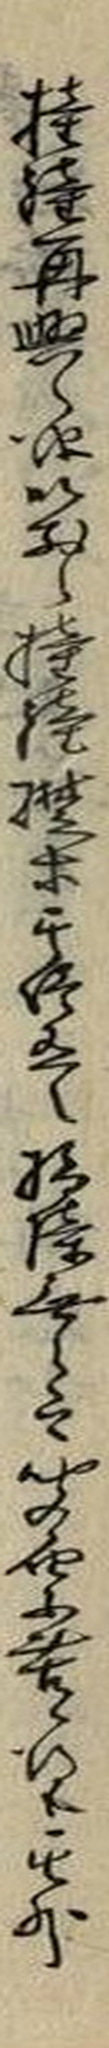撞鐘再興之儀以前之撞鐘礎等其儘有之指障無之候ハヽ聞届不苦候得共其外
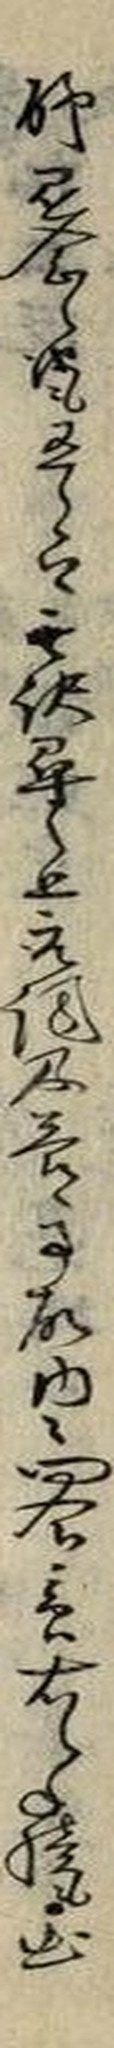聊懸念之儀も有之候ハヽ其訳尋之上取調及答候事故内々問合ニ而ハ右之手続も出
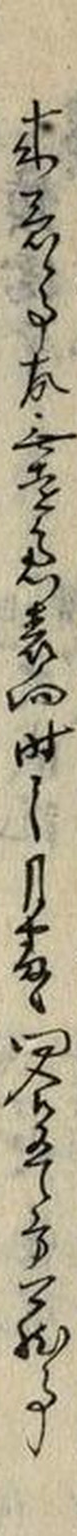来兼候事故無遠慮表向時之月番へ問合有之方可然事
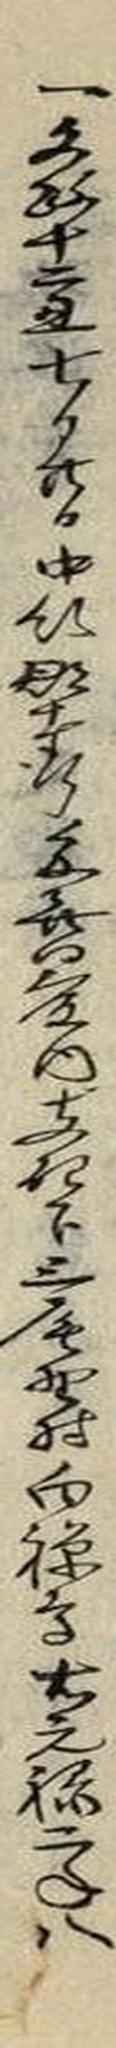一文政十二丑七月廿日中領郡奉行多喜田藤内支配下三尾野村白禅寺右元禄二年八
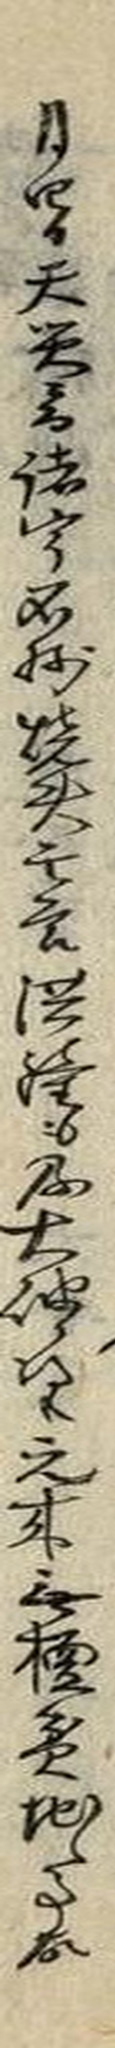月四日天災ニ而諸宇不残焼失其節洪鐘も及大破候得共元来無檀貧地之事故
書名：御国他国諸事之部
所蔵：福井県文書館 Fukui Prefectural Archives
